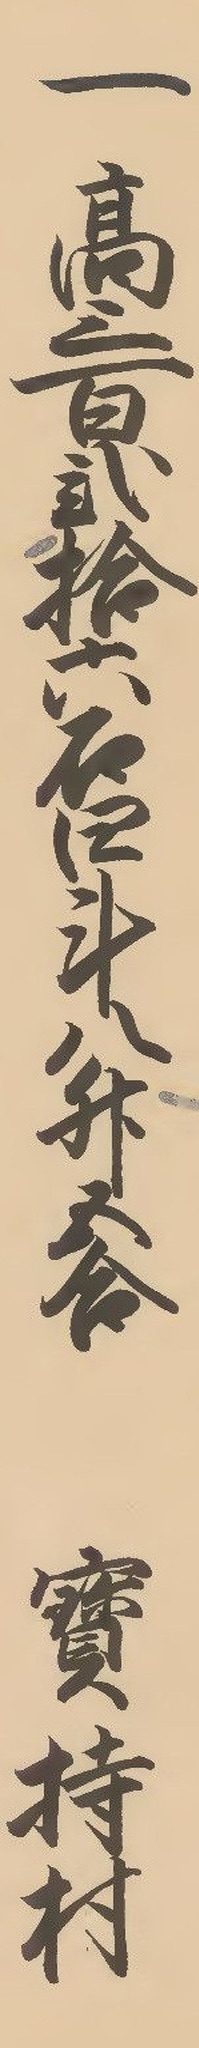一高三百弐拾六石四斗八升五合宝持村
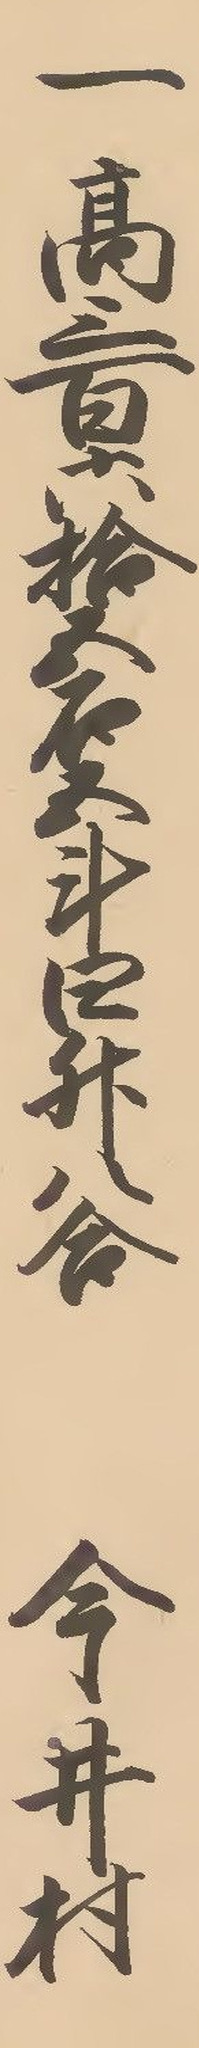一高三百六拾五石五斗四升八合今井村
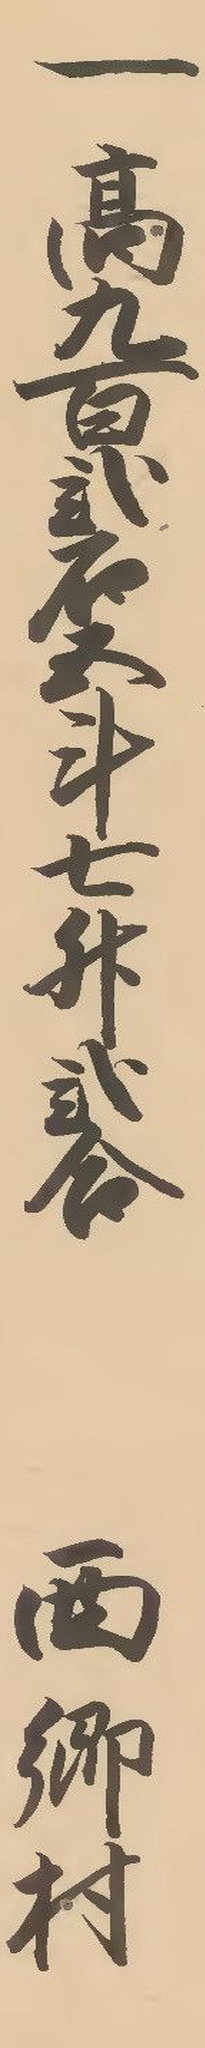一高九百弐石五斗七升弐合西郷村
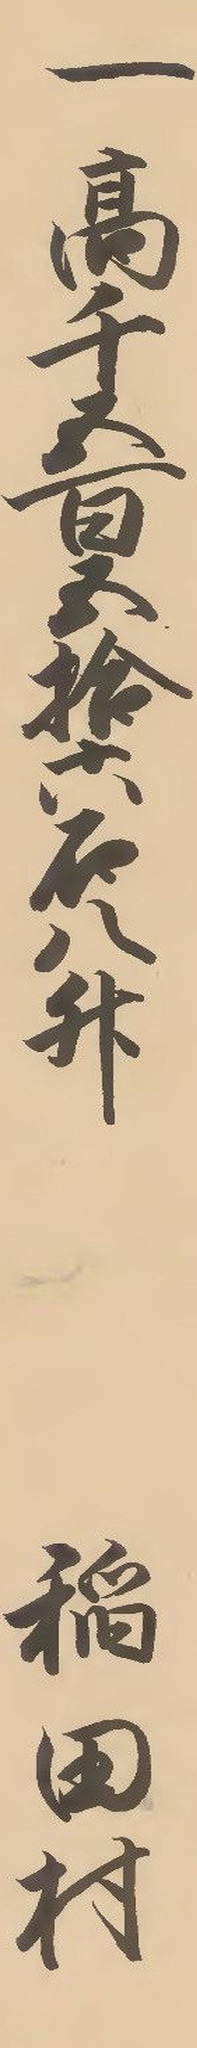一高千五百五拾六石八升稲田村
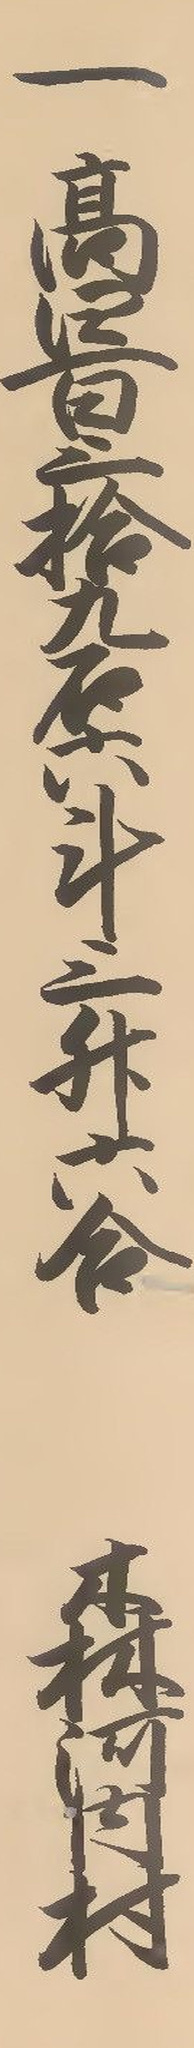一高四百三拾九石六斗三升六合森河内村
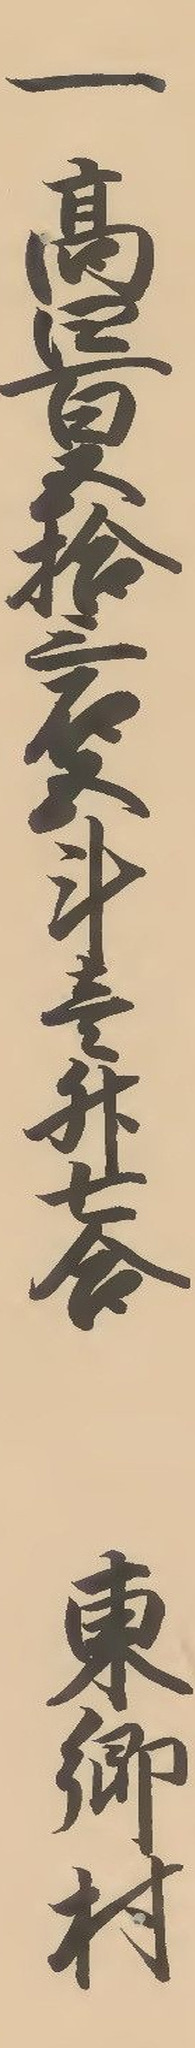一高四百五拾三石五斗壱升七合東郷村
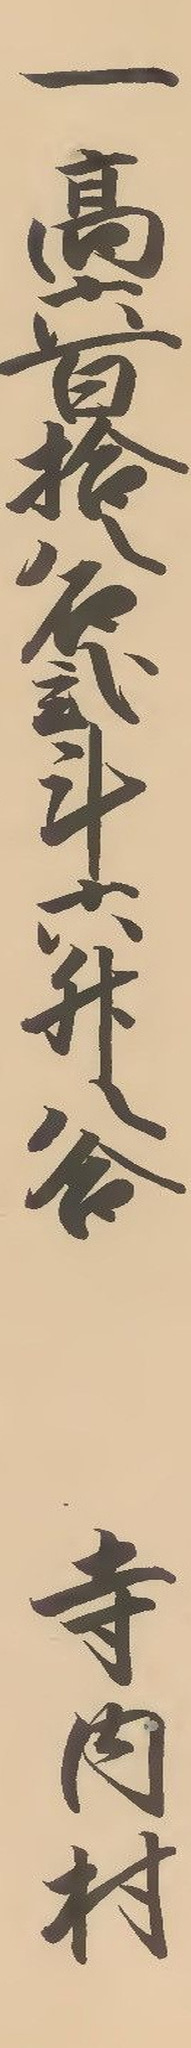一高六百拾八石弐斗六升八合寺内村
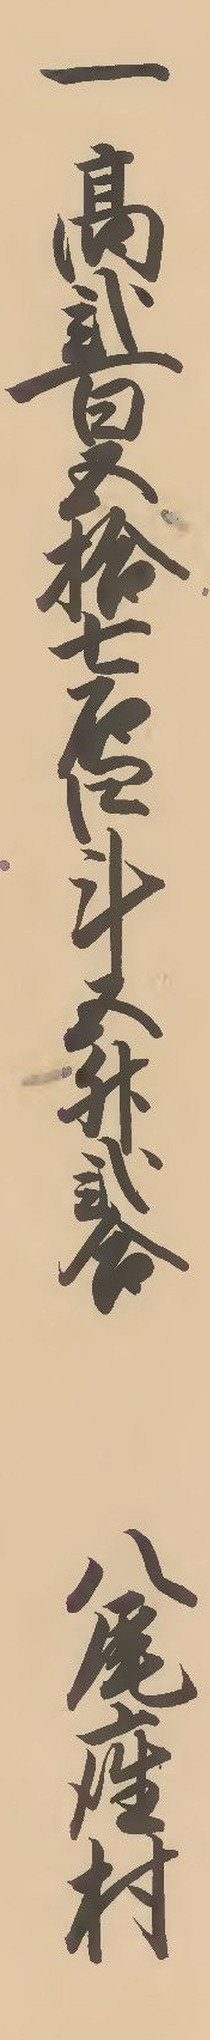一高弐百五拾七石四斗五升弐合八尾座村

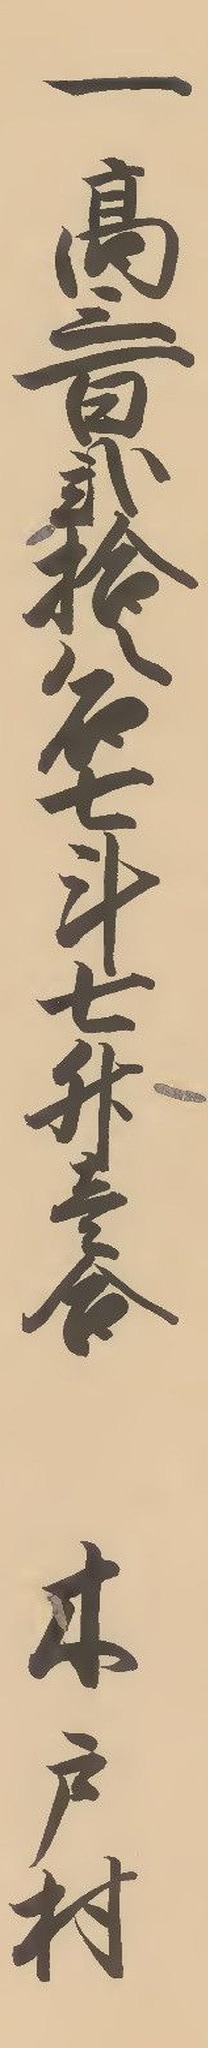一高三百弐拾八石七斗七升壱合木戸村
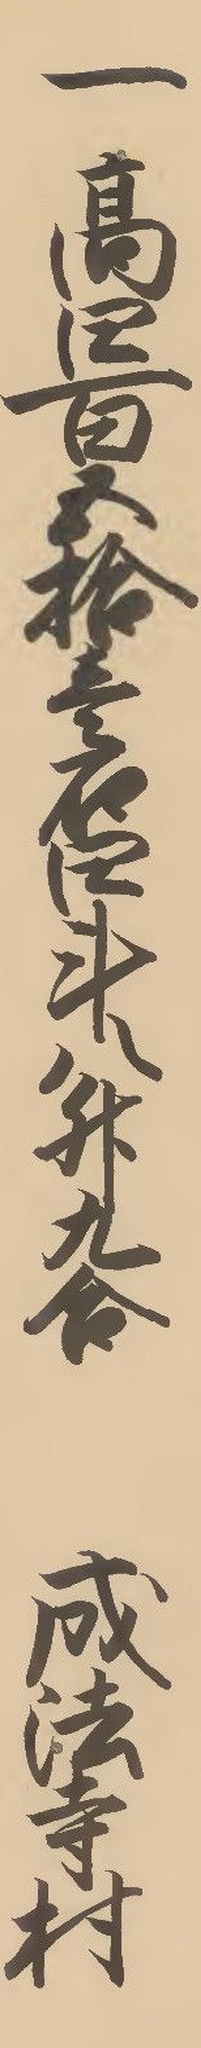一高四百五拾壱石四斗八升九合成法寺村
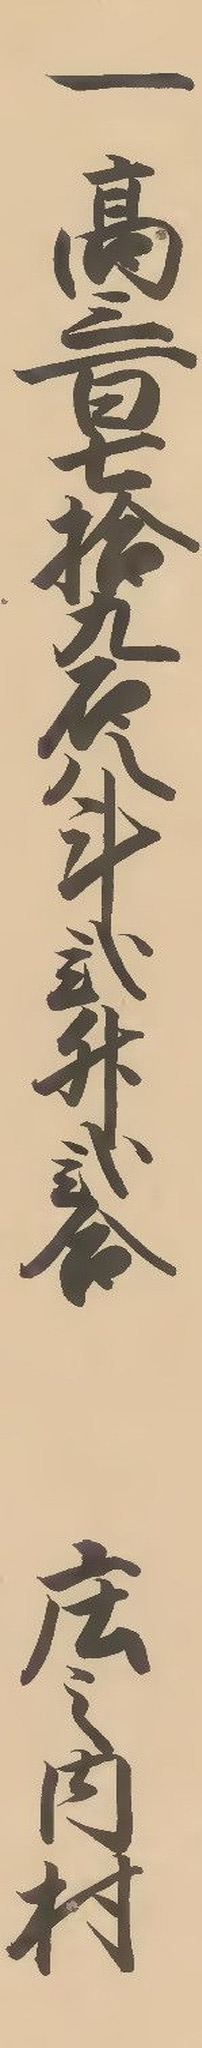一高三百七拾九石八斗弐升弐合庄之内村
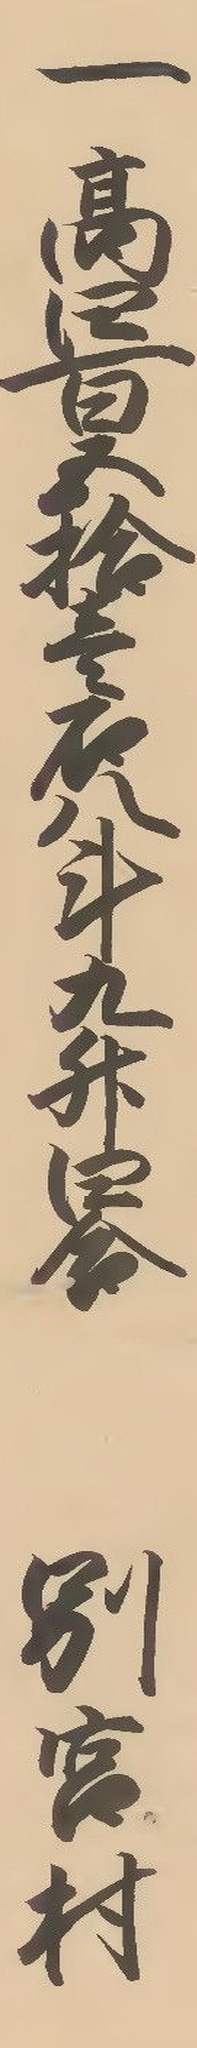一高四百五拾壱石八斗九升四合別宮村
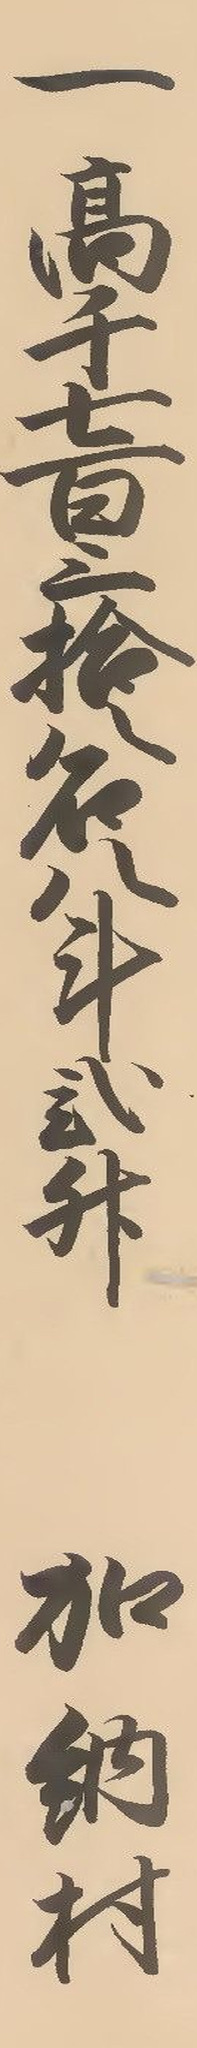一高千七百三拾八石八斗弐升加納村
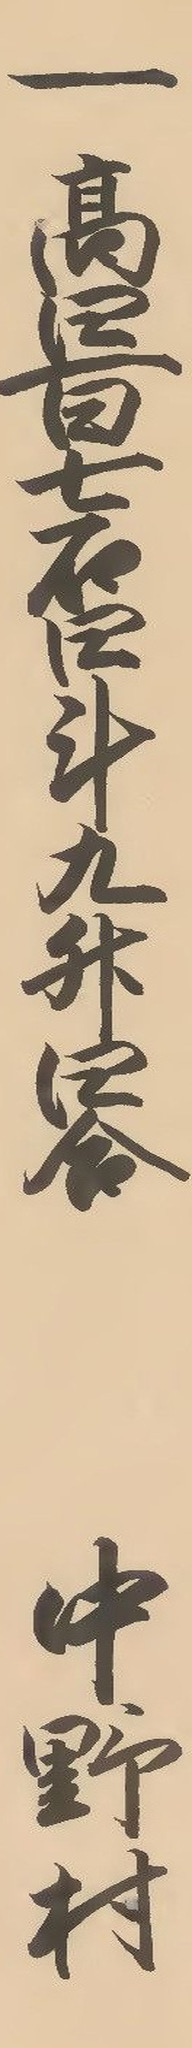一高四百七石四斗九升四合中野村
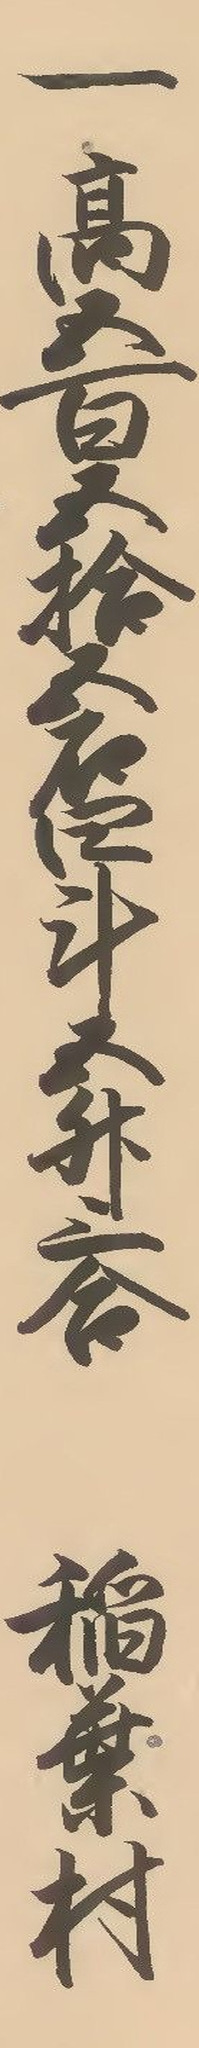一高五百五拾五石四斗五升三合稲葉村
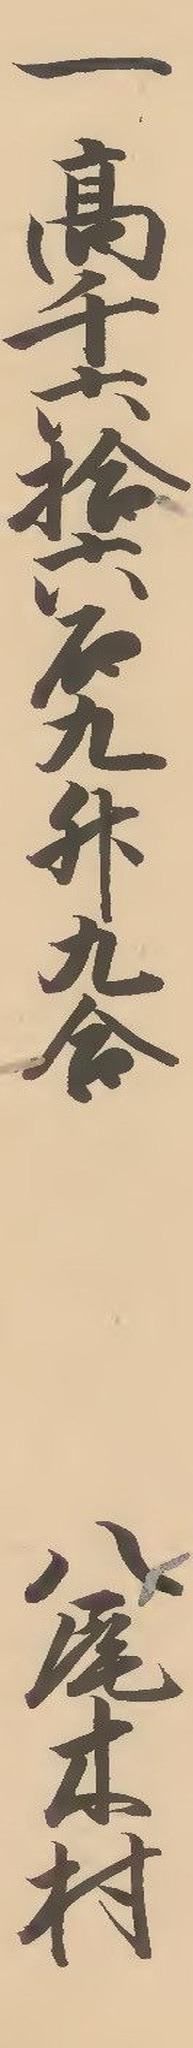一高千六拾六石九升九合八尾木村
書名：河内国郷帳
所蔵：国立公文書館 National Archives of Japan
